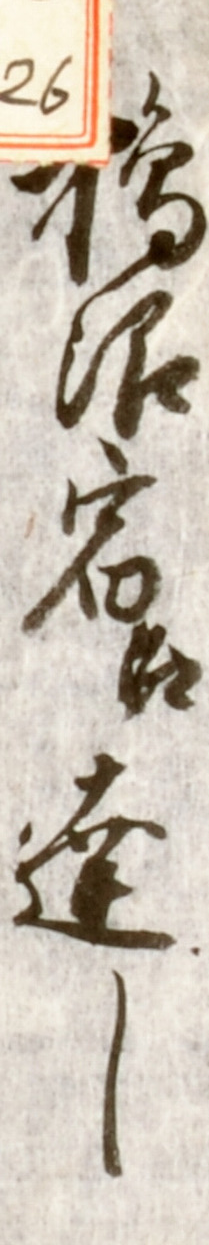鵜沼宿江達し
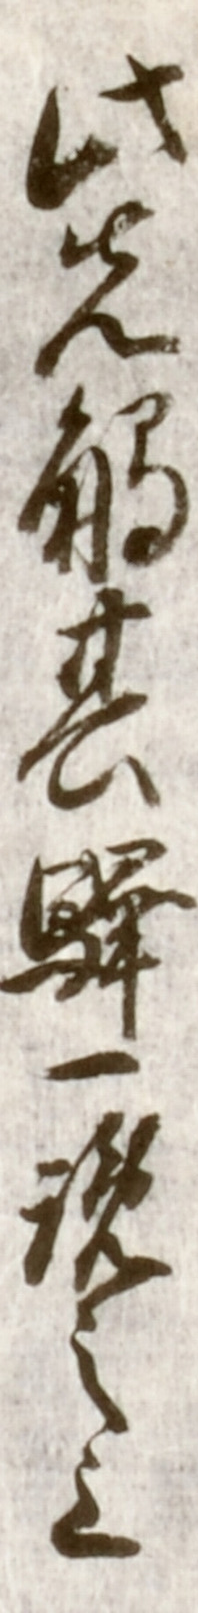此先触其駅一覧之上
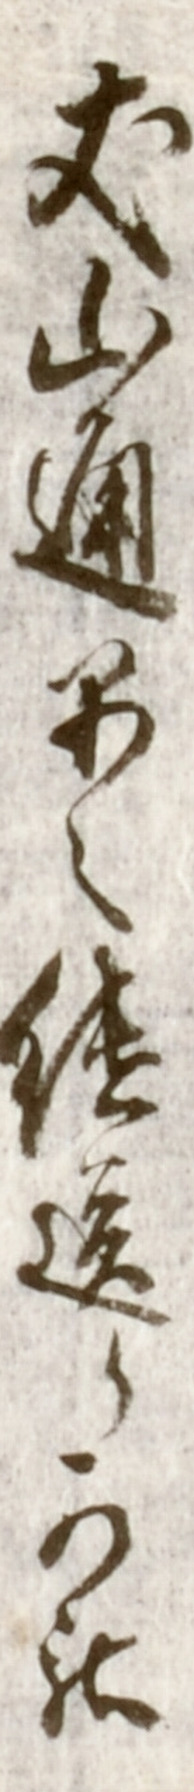丈山通早々継送り可被
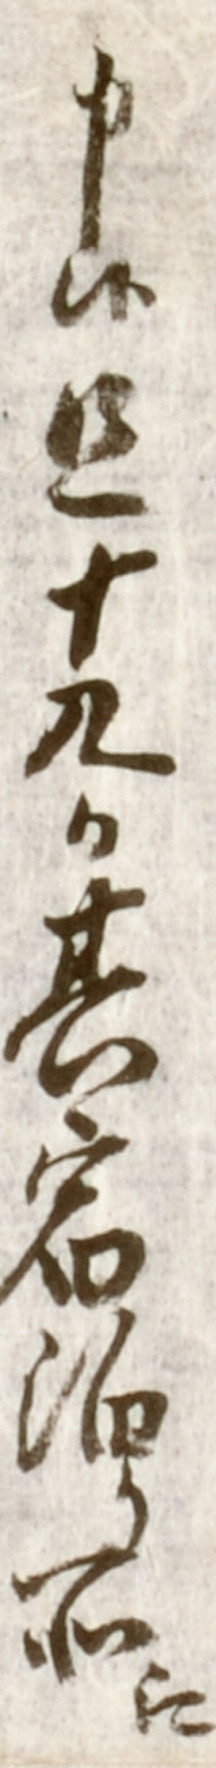申候且十九日其宿泊り所江
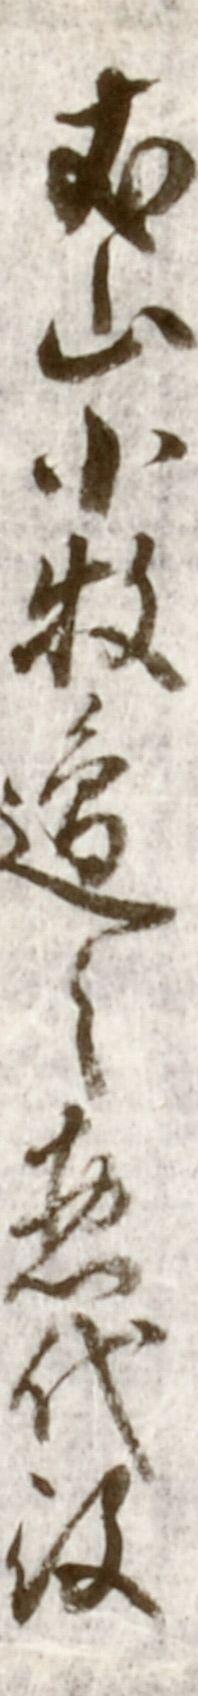丈山小牧辺之惣代役
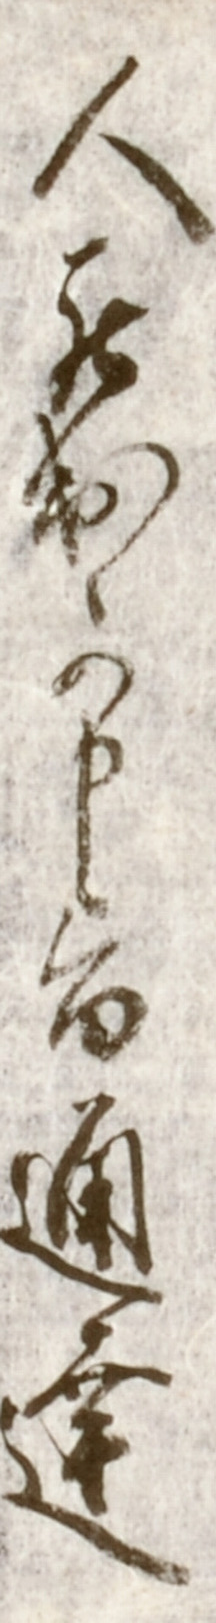人罷出可申旨通達
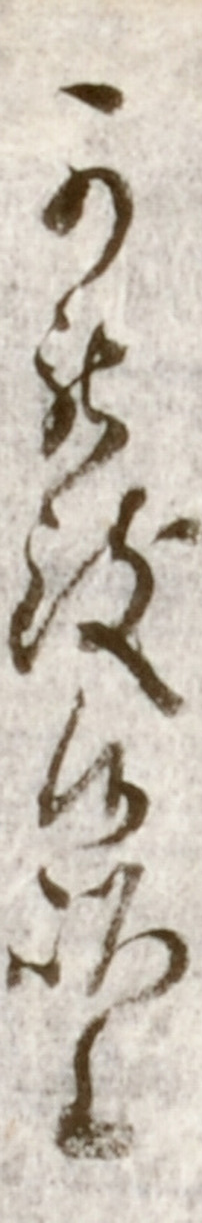可被致候以上
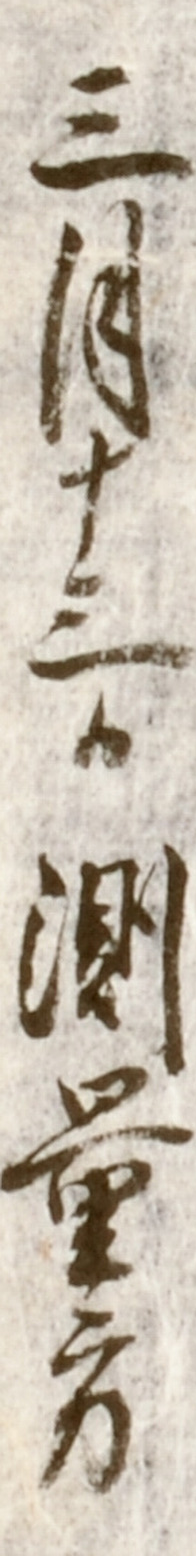三月十三日測量方
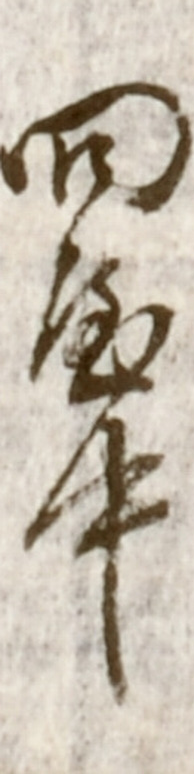問屋中
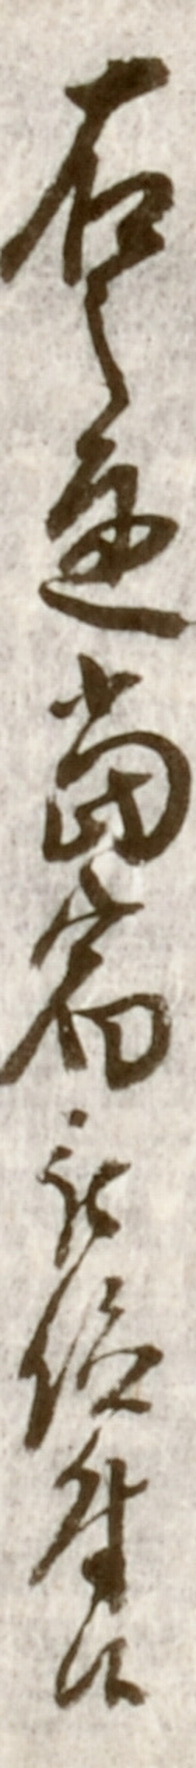右之通当宿被仰付候
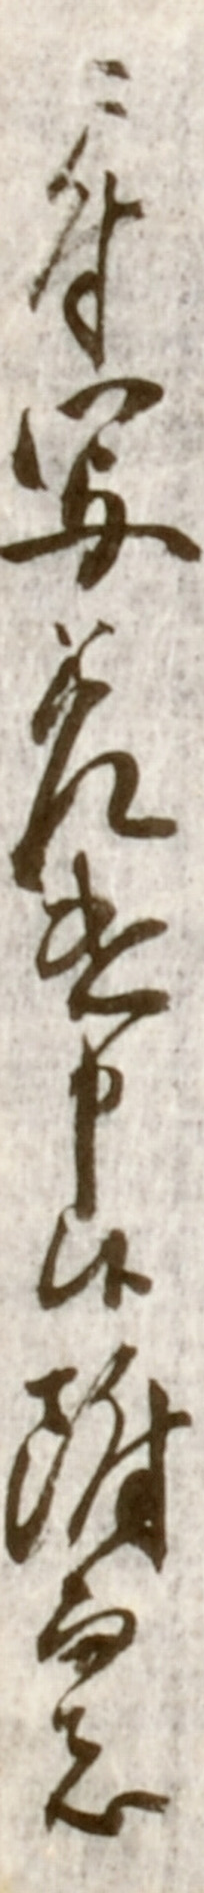ニ付写差遣申候附而は
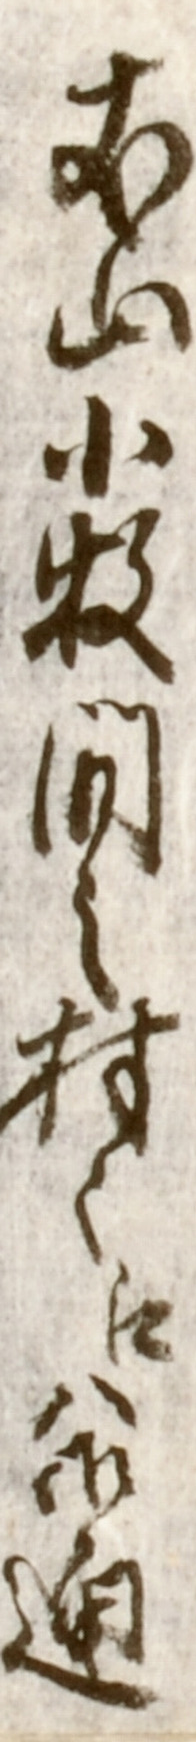丈山小牧間之村々江ハ御通
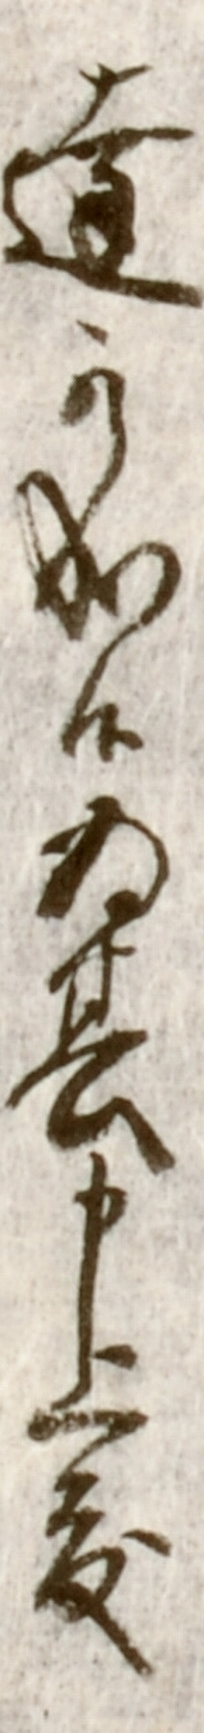達可成候為其申上度
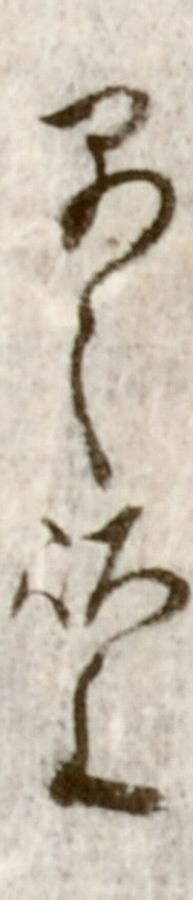早々以上
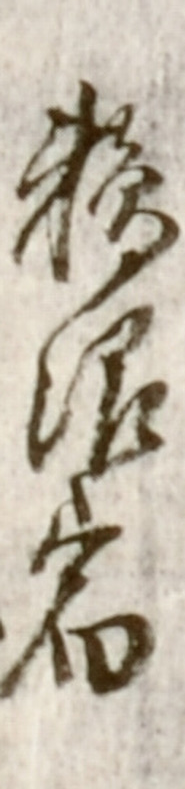鵜沼宿
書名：（先触写）
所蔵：伊那市立高遠町図書館・合同会社AMANE
